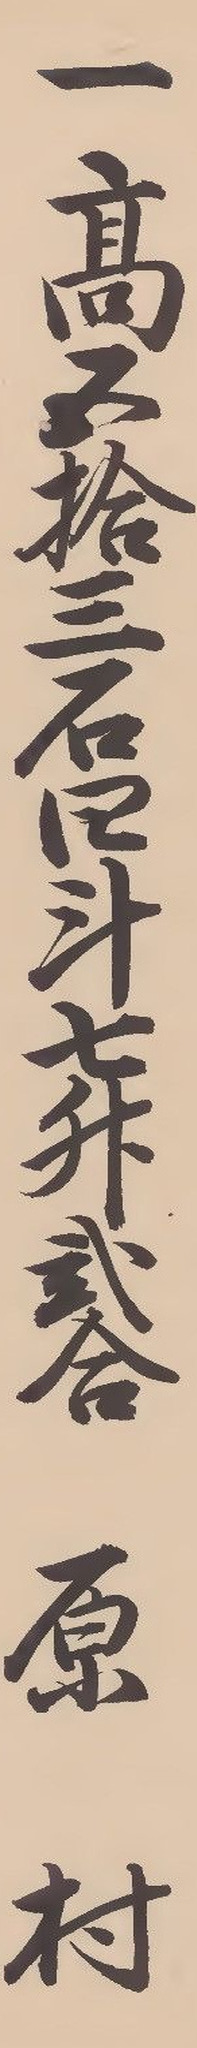一高五拾三石四斗七升弐合原村
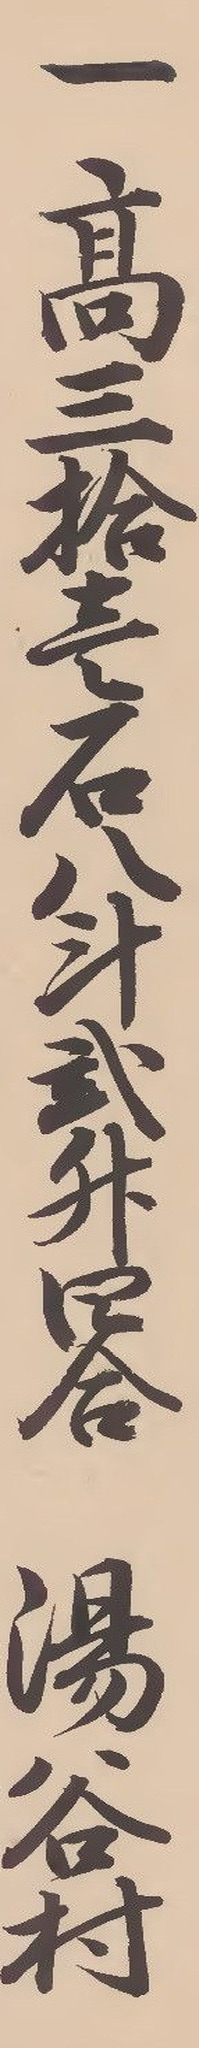一高三拾壱石八斗弐升四合湯谷村
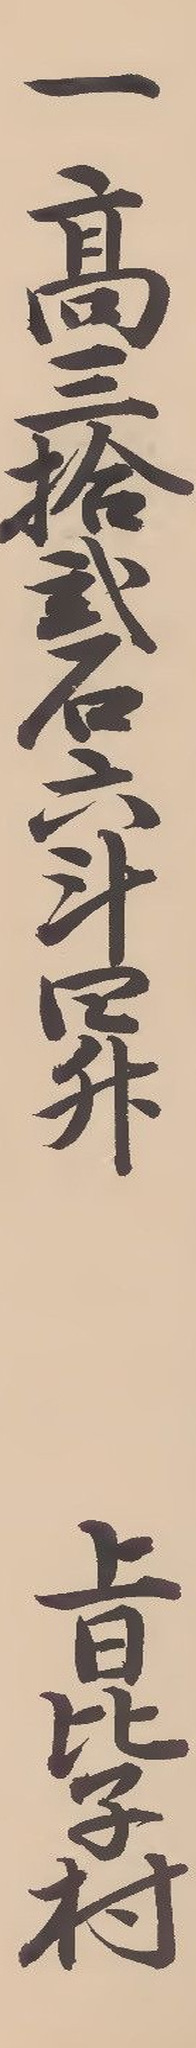一高三拾弐石六斗四升上昆子村
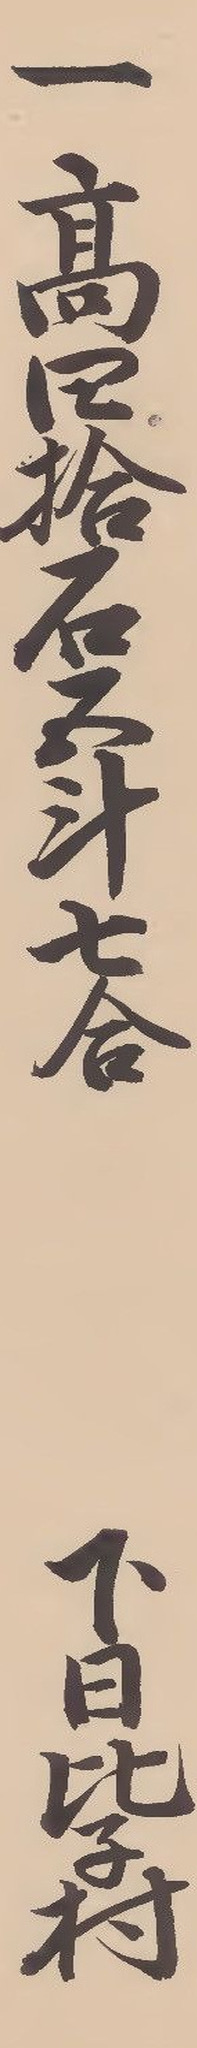一高四拾石五斗七合下昆子村
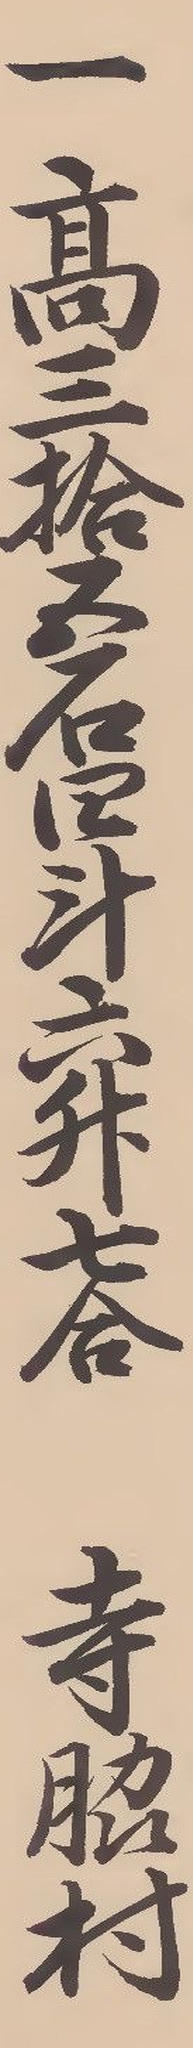一高三拾五石四斗六升七合寺脇村

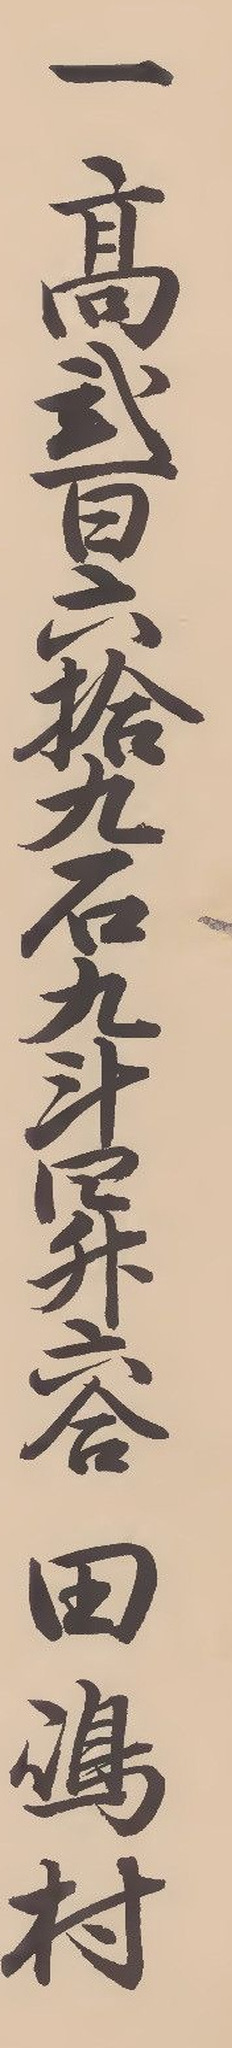一高二百六拾九石九斗四升六合田島村
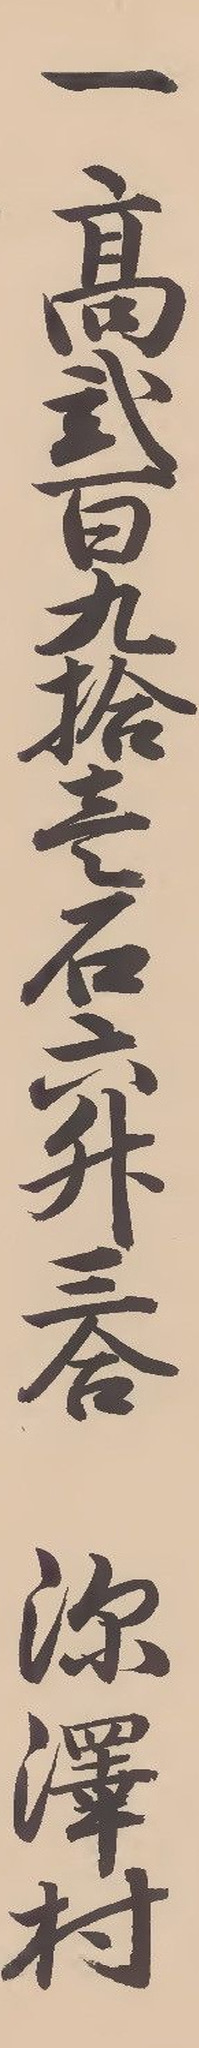一高弐百九拾壱石六升三合深沢村
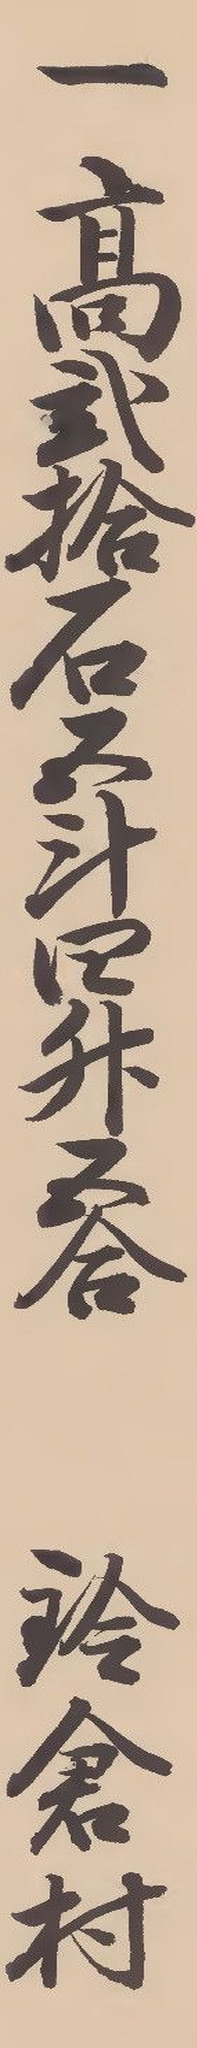一高弐拾石五斗四升五合鈴倉村
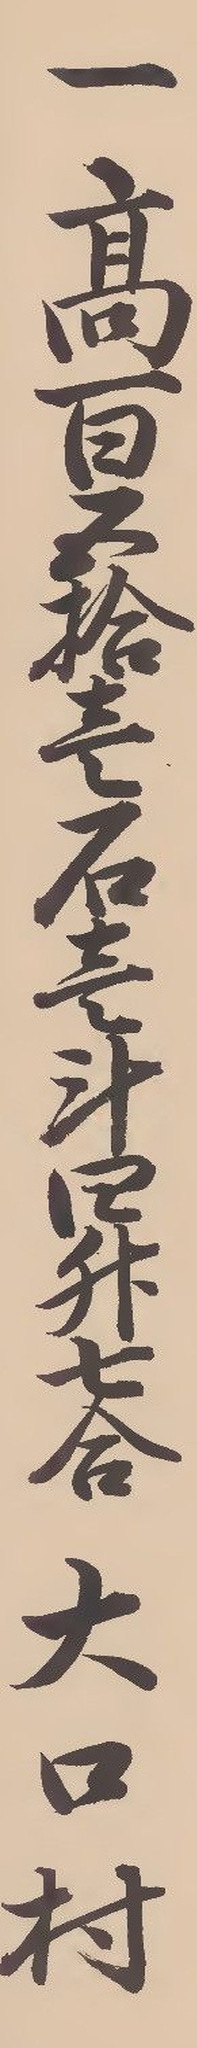一高百五拾壱石壱斗四升七合大口村
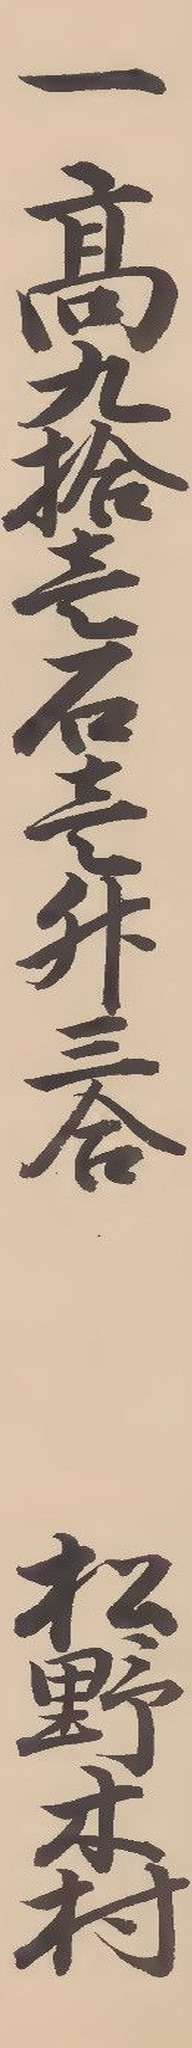一高九拾壱石壱升三合松野木村
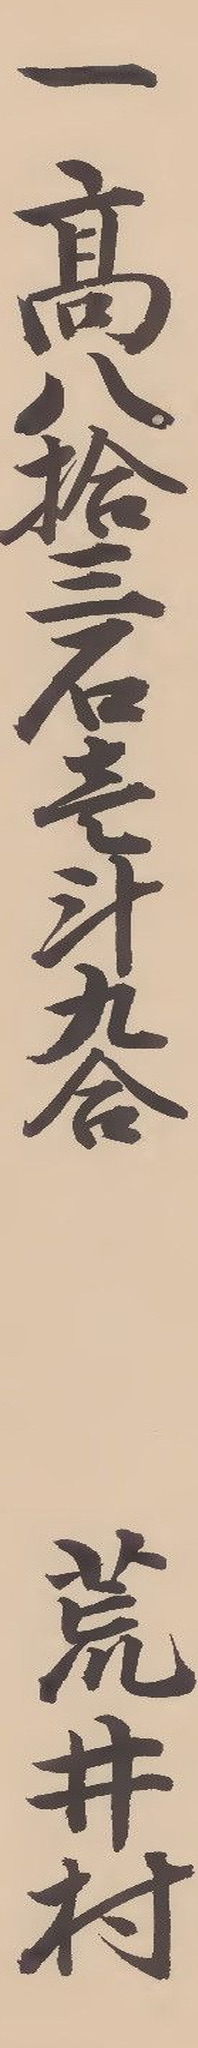一高八拾三石壱斗九合荒井村
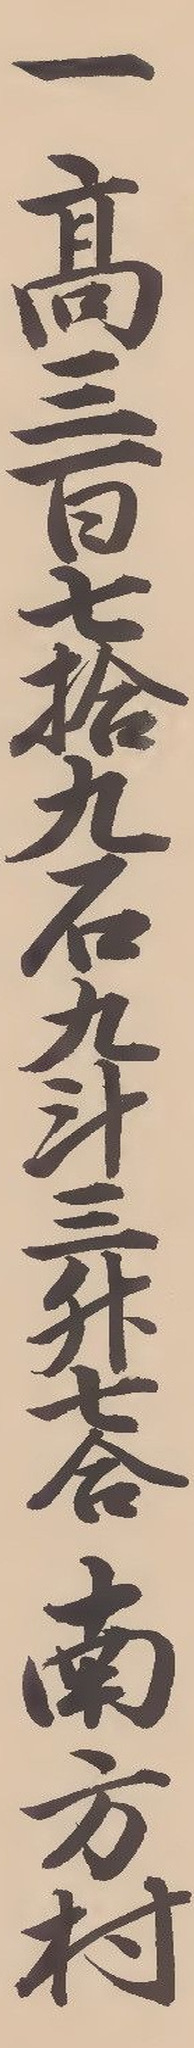一高三百七拾九石九斗三升七合南方村
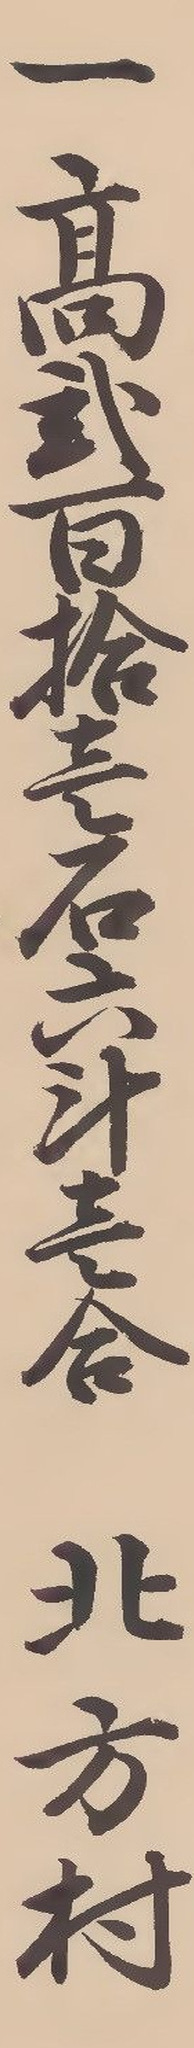一高弐百拾壱石六斗壱合北方村

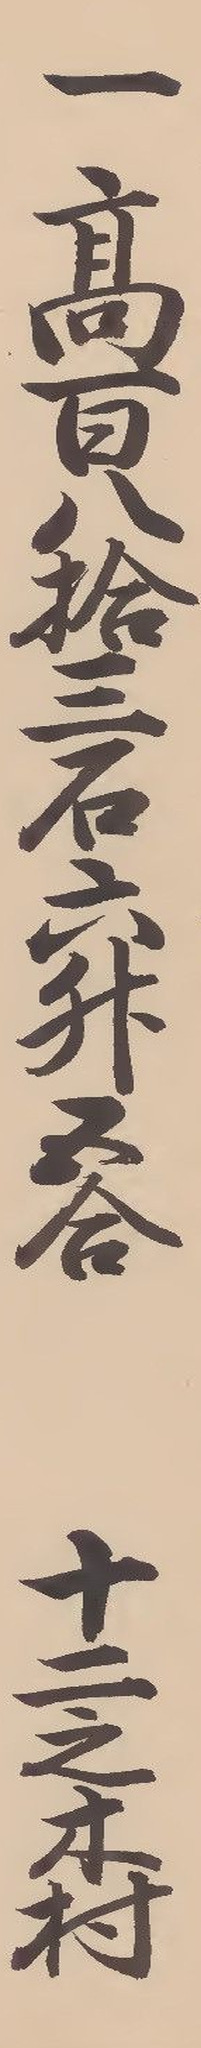一高百八拾三石六升五合十二之木村
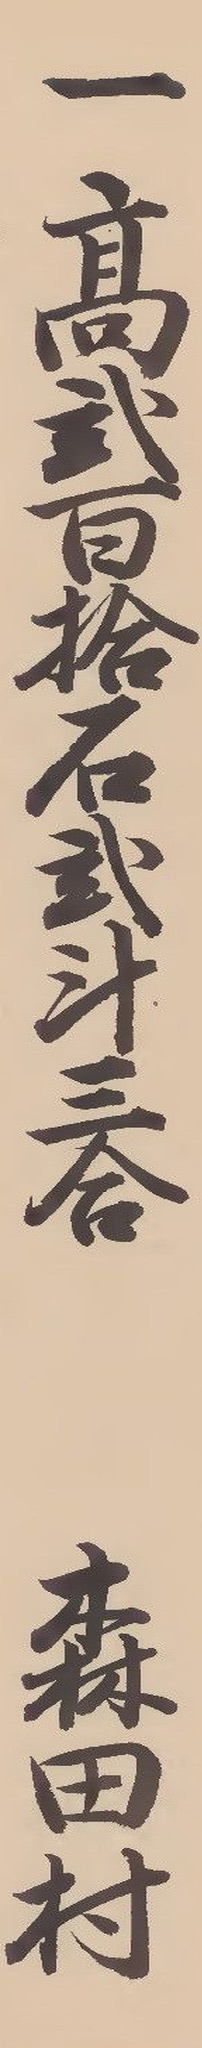一高弐百拾石弐斗三合森田村
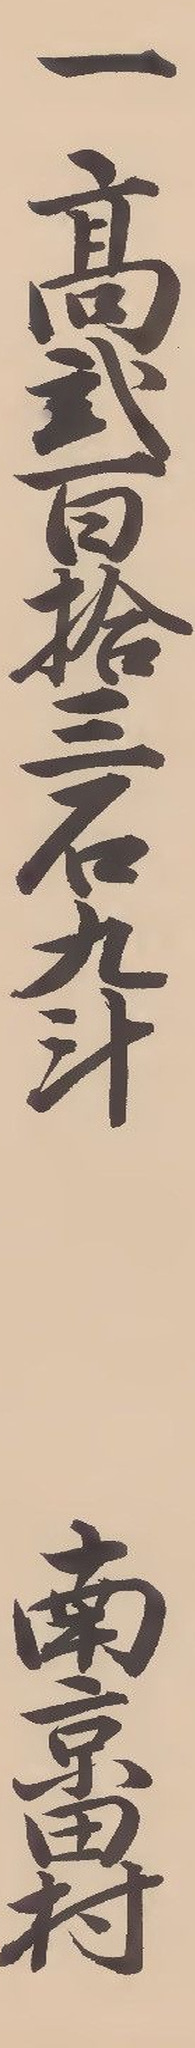一高弐百拾三石九斗南京田村
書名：越後国郷帳　上
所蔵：国立公文書館 National Archives of Japan
